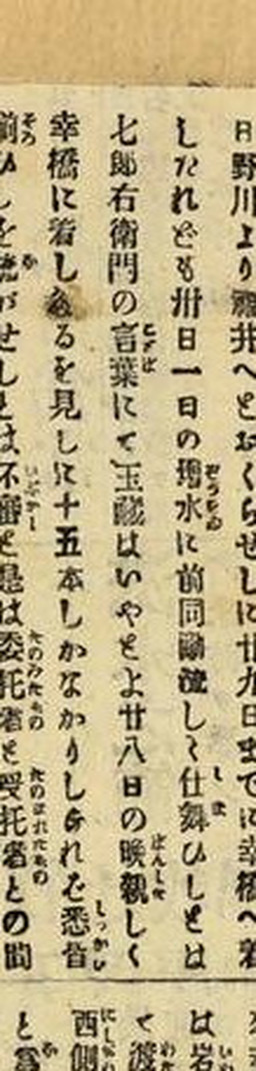七郎右衛門の言葉にて玉藏はいやとよ廿八日の晩親しく
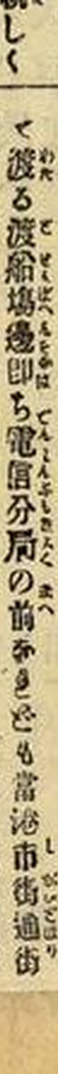て渡る渡船塲邊卽ち電信分局の前なれども當港市街通街
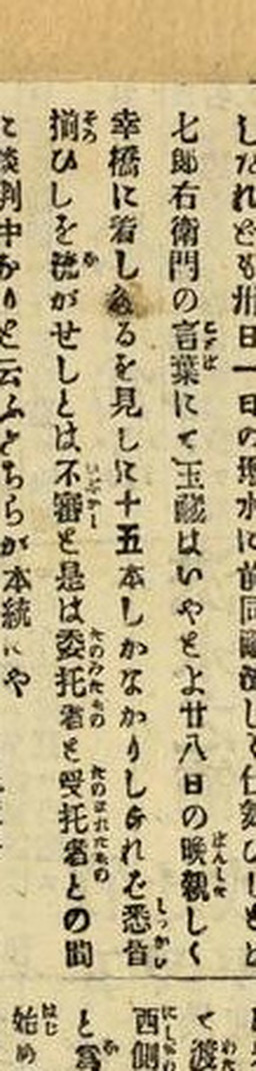幸橋に着したるを見しに十五本しかなかりしければ悉皆
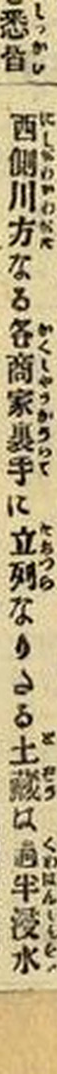西側川方なる各商家裏手に立列なりたる土藏は過半浸水
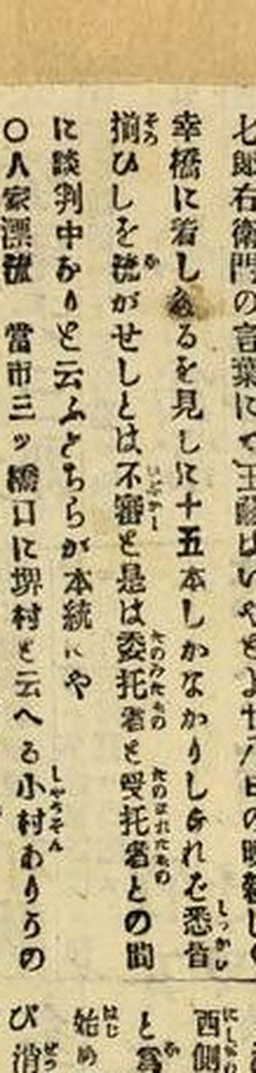揃ひしを流がせしとは不審と是は委托者と受托者との間
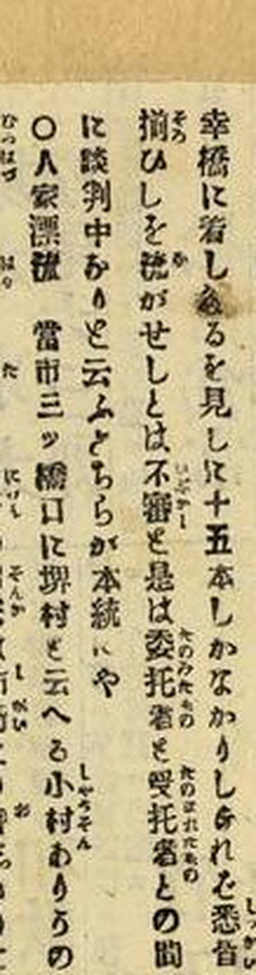に談判中なりと云ふどちらが本統にや
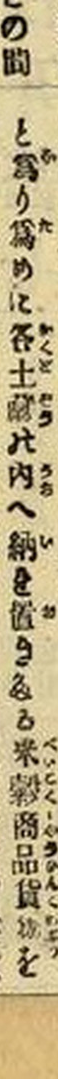と爲り爲めに各土藏の内へ納れ置きたる米穀商品貨物を
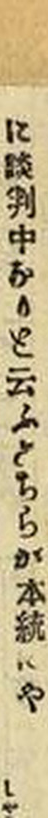に談判中なりと云ふどちらが本統にや
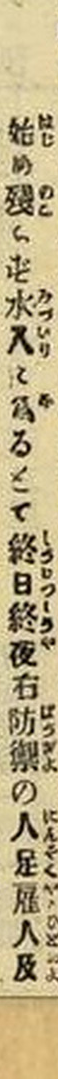始め殘らず水入に爲るとて終日終夜右防禦の人足雇人及
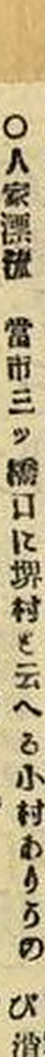○人家漂流當市三ッ橋口に堺村と云へる小村ありかの
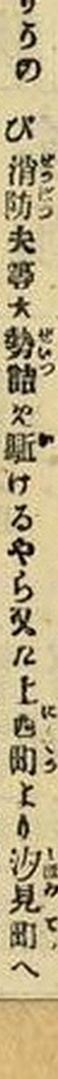び消防夫等大勢詰め駈けるやら又た上西町より汐見町へ
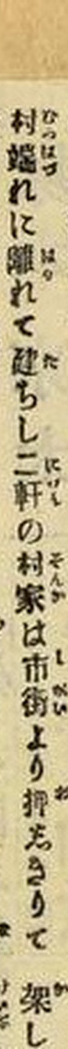村端れに離れて建ちし二軒の村家は市街より押しきりて
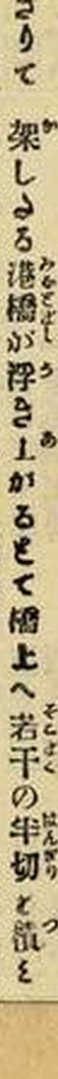架したる港橋が浮き上がるとて橋上へ若干の半切を積み
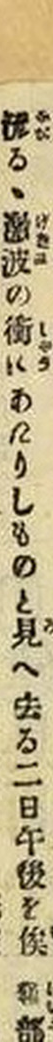流るゝ激波の衝にあたりしものと見へ去る二日午後を俟
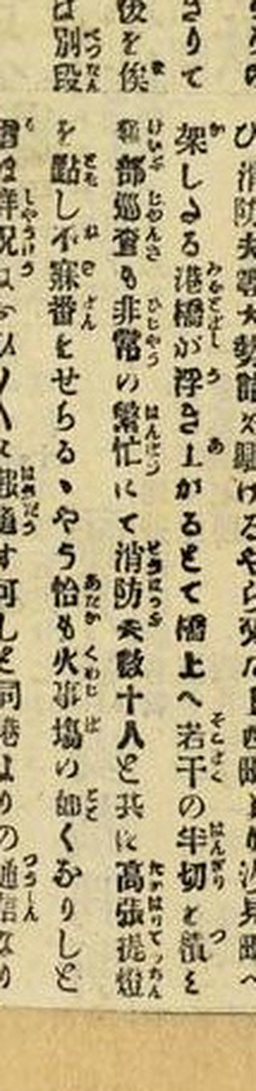警部巡査も非常の繁忙にて消防夫數十人と共に高張提燈
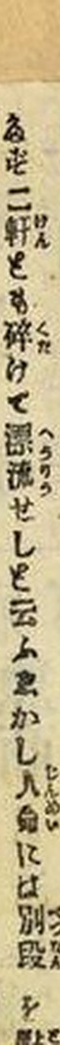たず二軒とも碎けて漂流せしと云ふしかし人命には別段
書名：温古集 五巻
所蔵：福井県文書館 Fukui Prefectural Archives
